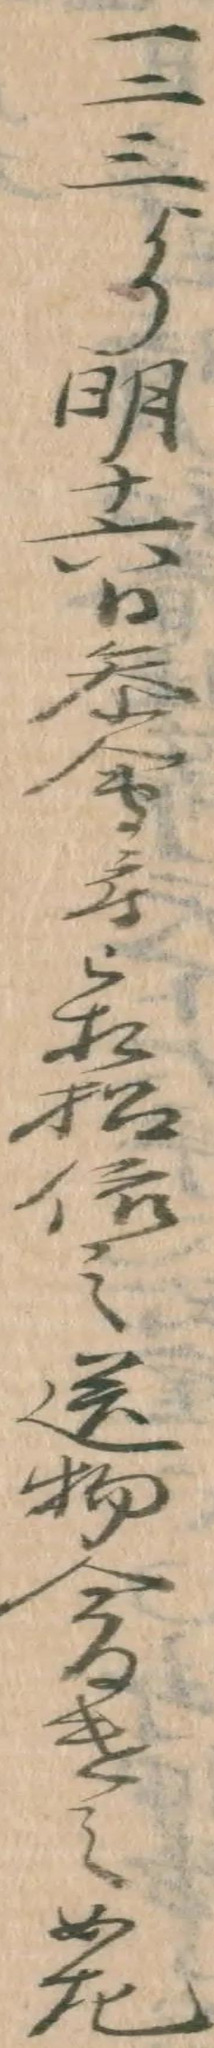一二三より明十六日参會ニ付被相招依之送物今日遣之如左
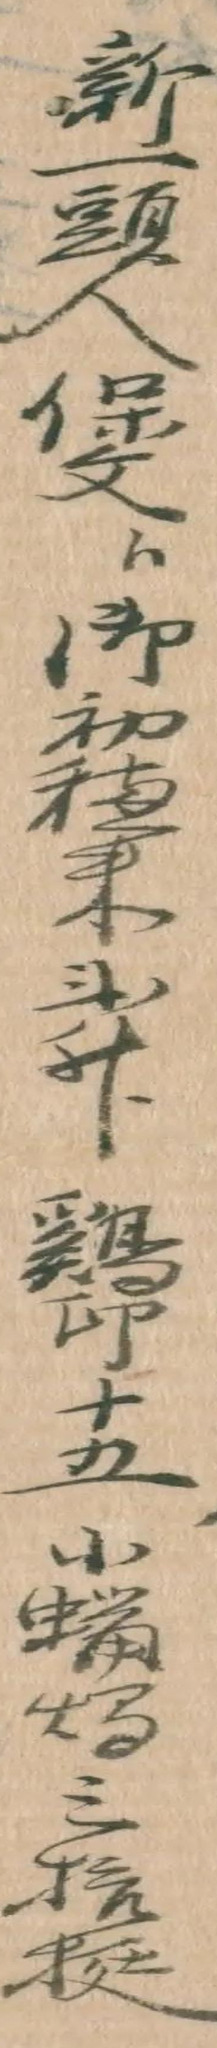新一頭人保文江御初穂米弐升鶏卵十五小蝋燭三拾挺
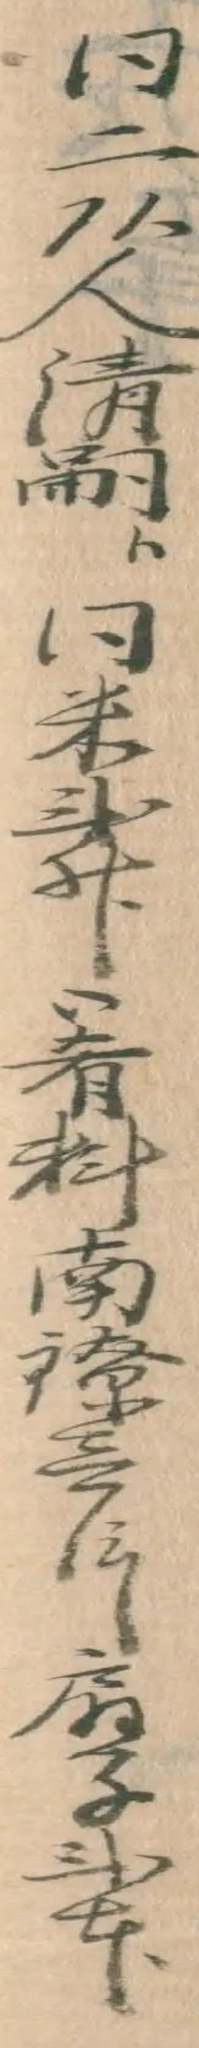同二頭人清嗣江同米弐升御肴料南鐐壱升扇子弐本
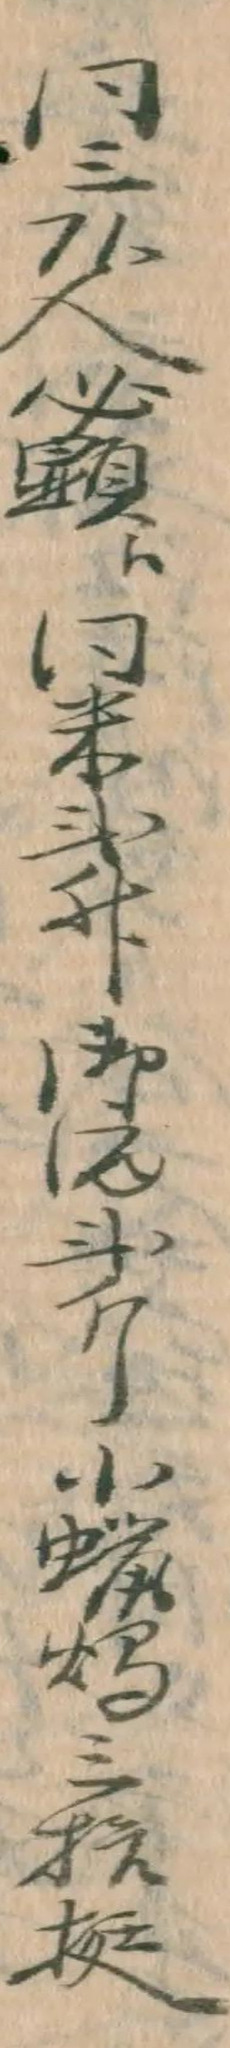同三頭人必顕江同米弐升御酒弐升小蝋燭三拾挺
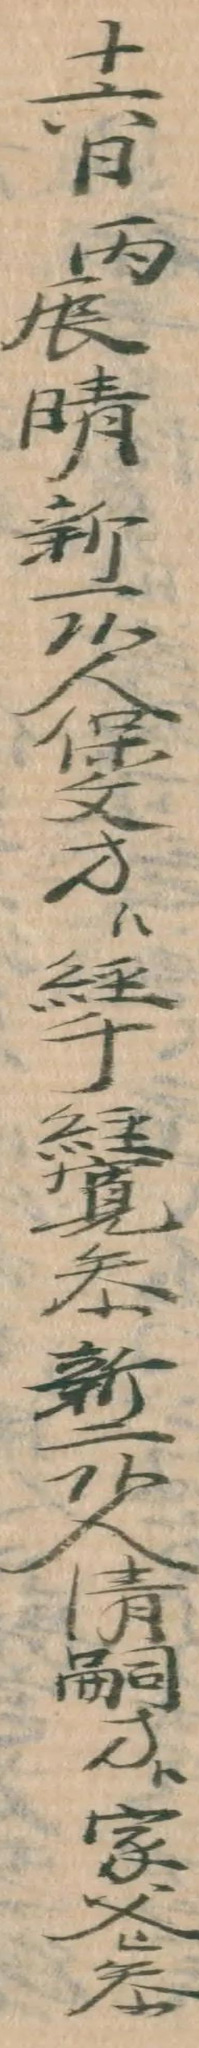十六日丙辰晴新頭人保文方江経丁経覚参新二八人清嗣方ト家父被参
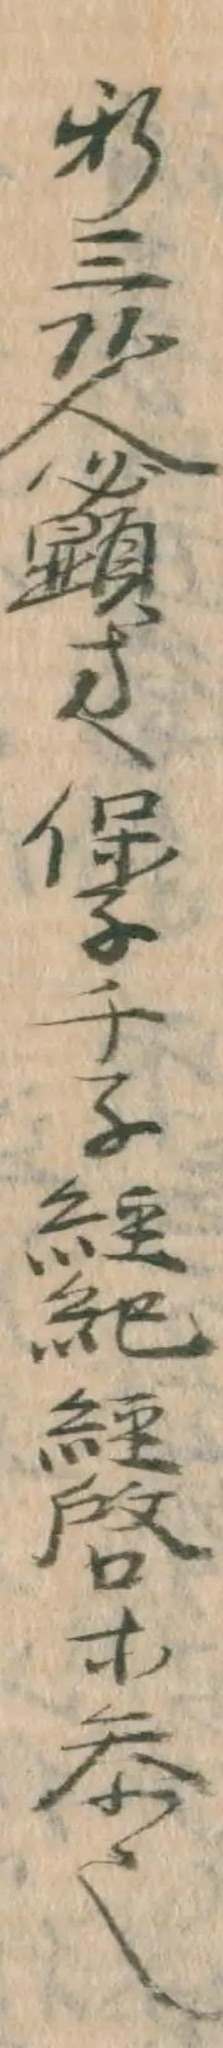新三頭人必顕方へ保子千子經紀經啓等参也
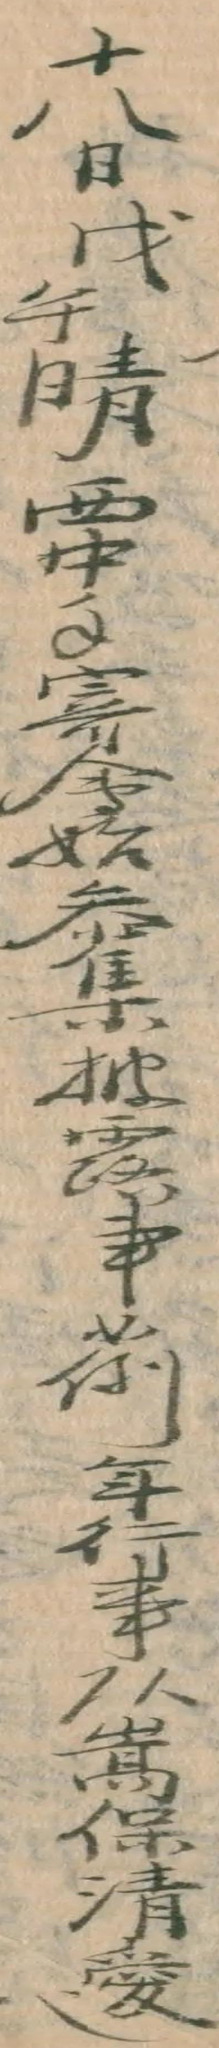十八日戊午晴西中に寄会始参集披露事如例年行事頭嵩保清愛也
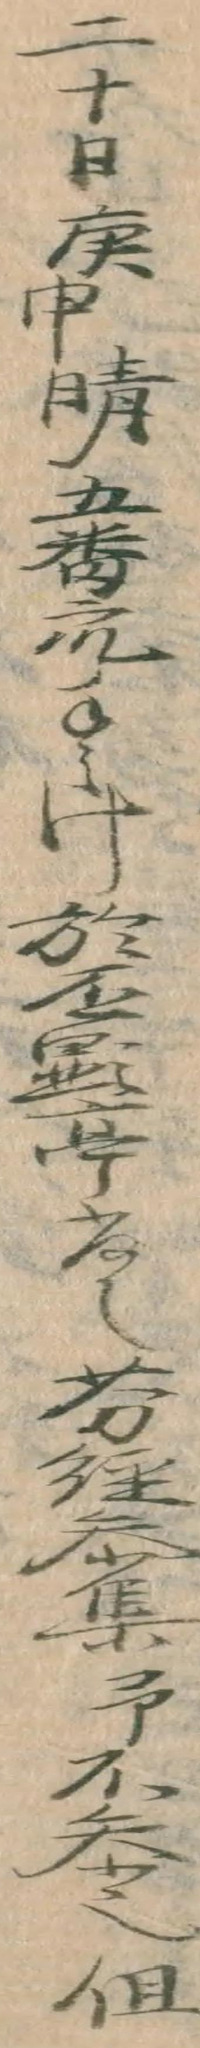二十日庚申晴五番衆手之汁於丕顕亭有之芬経参集予不参也但
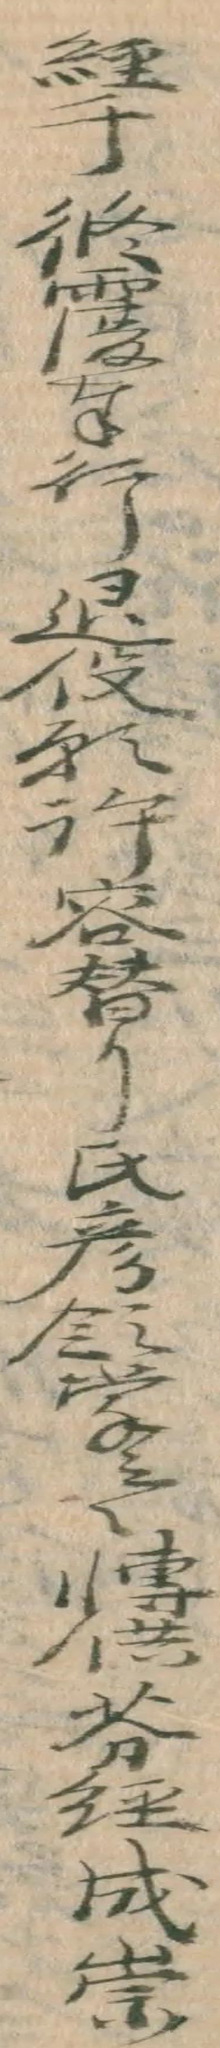経千修覆奉行退役願許容替り氏彦領掌云々傳供芬経成崇
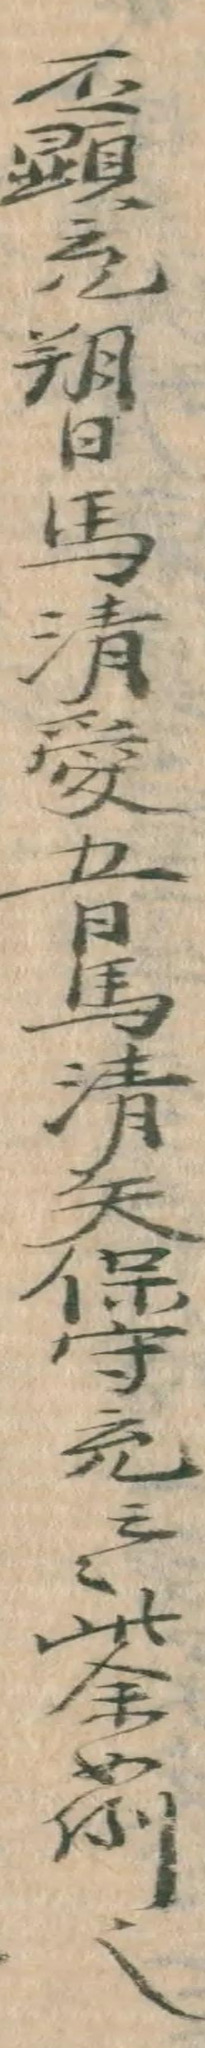丕顕充朔日馬清愛五日馬清矢保守宛云〻此余如例也
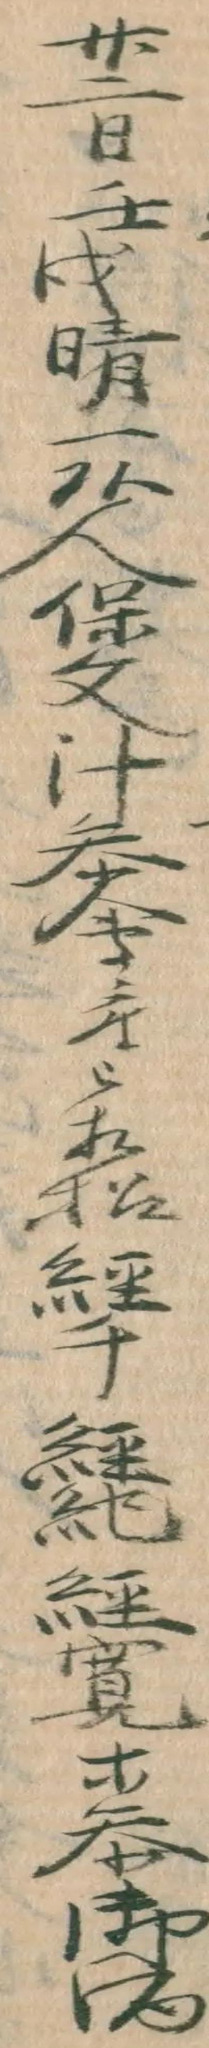廿二日壬戌晴一頭人保文汁参會ニ付被相招経千經寛等参御酒
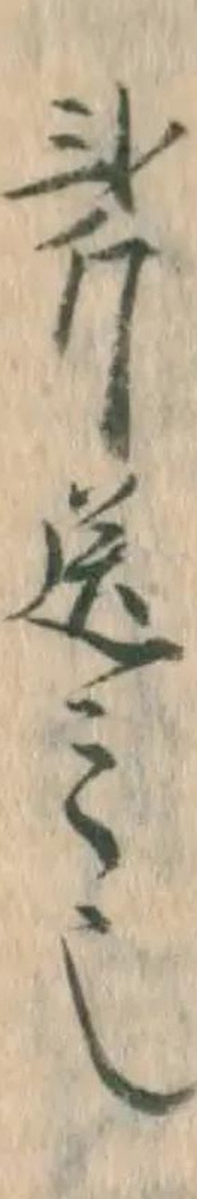弐升送之也
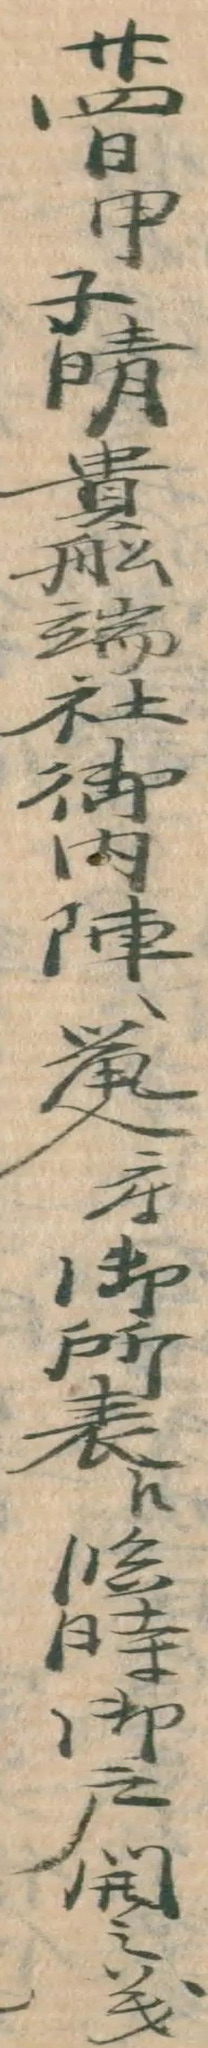廿四日甲子晴貴舩端社御内陣へ鼠入ニ付御所表江臨時御戸開之義
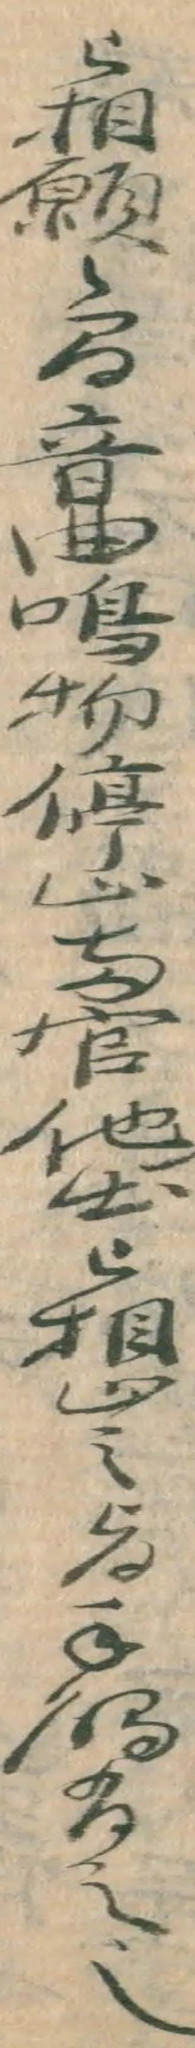被相願候間音曲物停止両官他出被相止之旨手触有之也
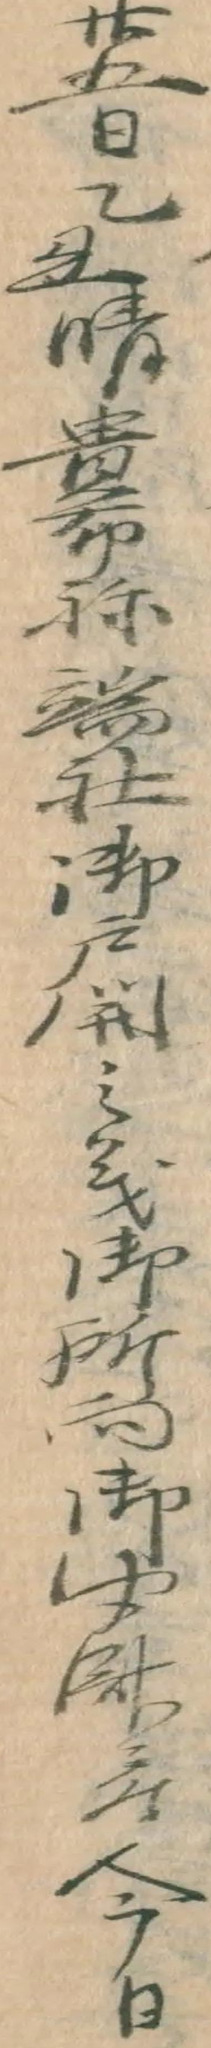廿五日乙丑晴貴布様端社御戸開之義御所向御由済ニ付人元日

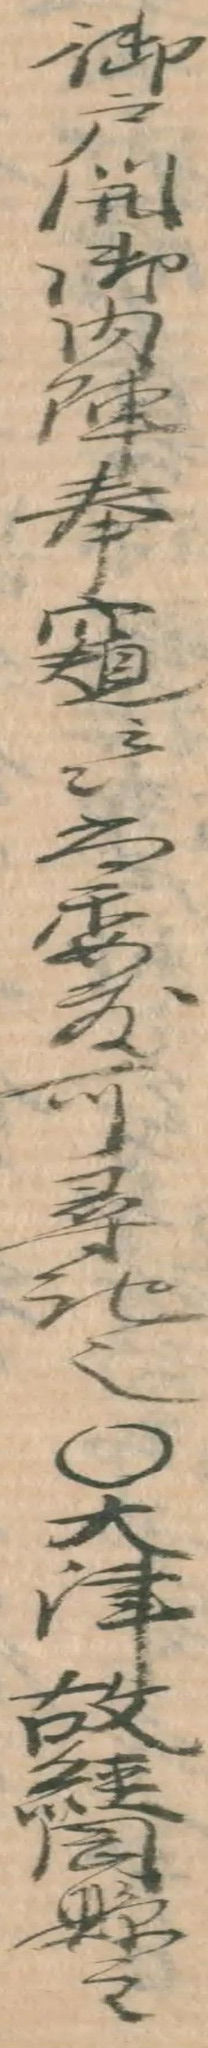御戸開御内陣奉窺云〻尚委敷可尋記也〇大津故経岡縣主
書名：賀茂社記録. 第65冊
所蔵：国立国会図書館 National Diet Library, JAPAN
